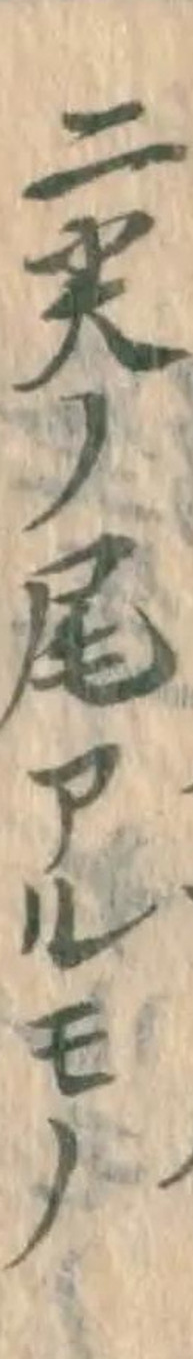二尖ノ尾アルモノ
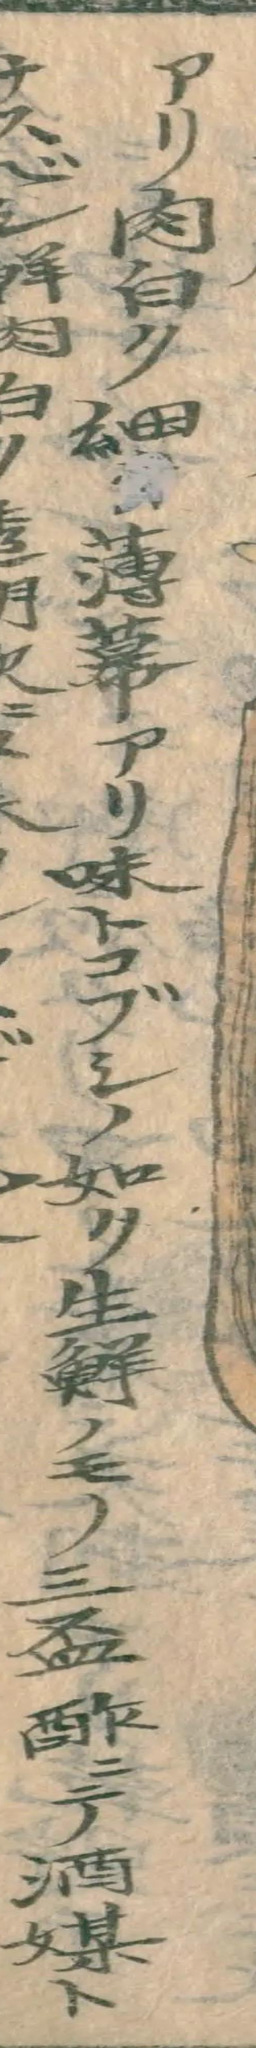アリ肉白ク細薄幕アリ味トコブシノ如ク生鮮ノモノ三盃酢ニテ酒媒ト
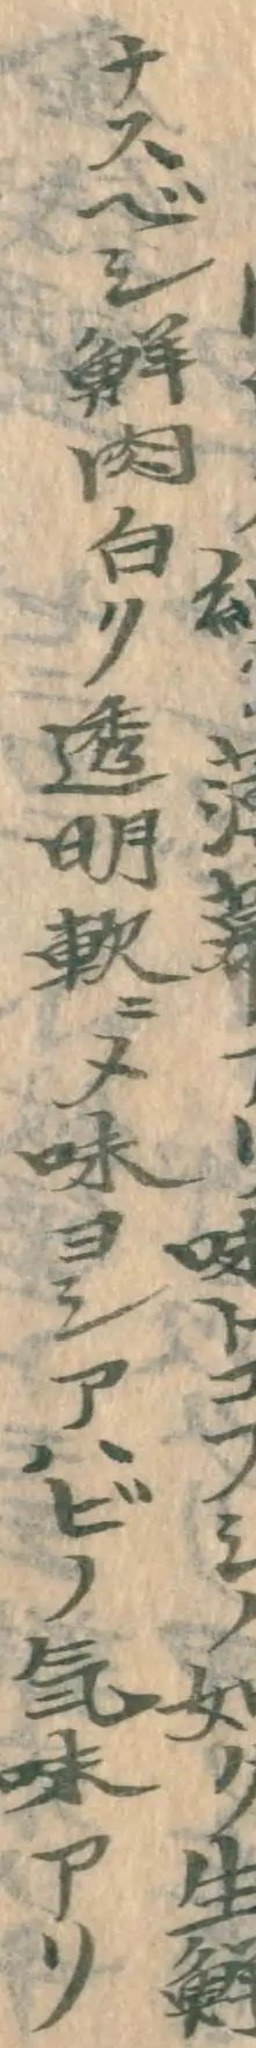ナスベシ鮮肉白ク透明軟ニシテ味ヨシアハビノ気味アリ

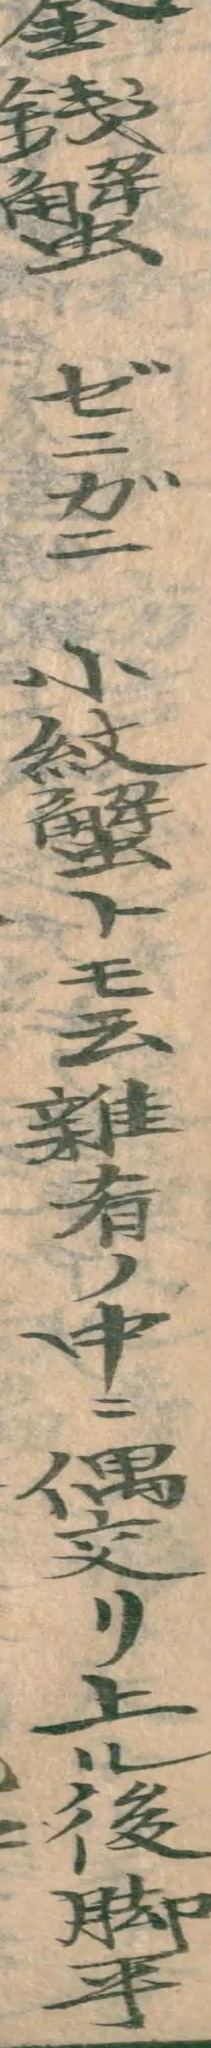金銭蟹ゼニガニ小紋蟹トモ云雜肴ノ中ニ偶交リ上ル後脚平
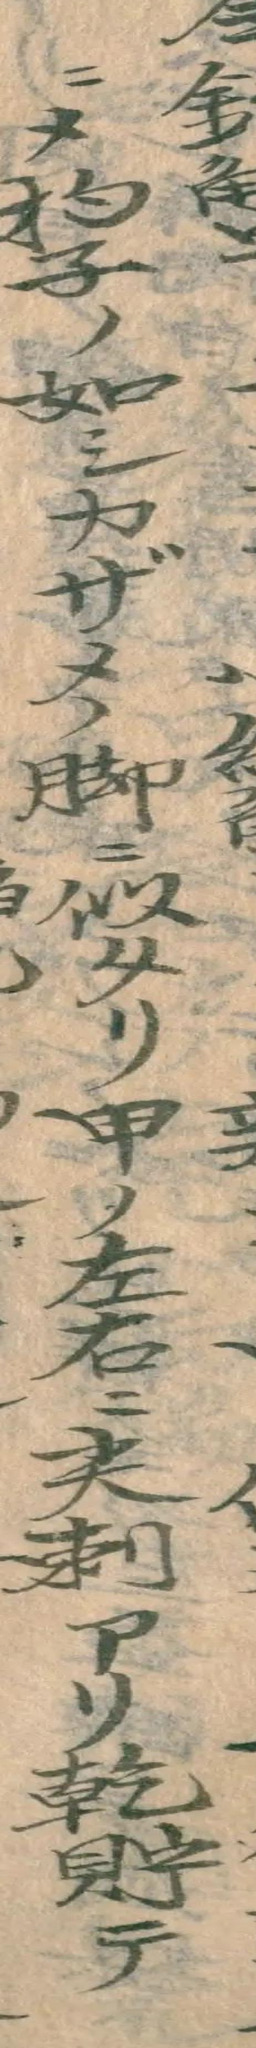ニシテ杓子ノ如シカザメノ脚ニ似タリ甲ノ左右ニ尖刺アリ乾貯テ
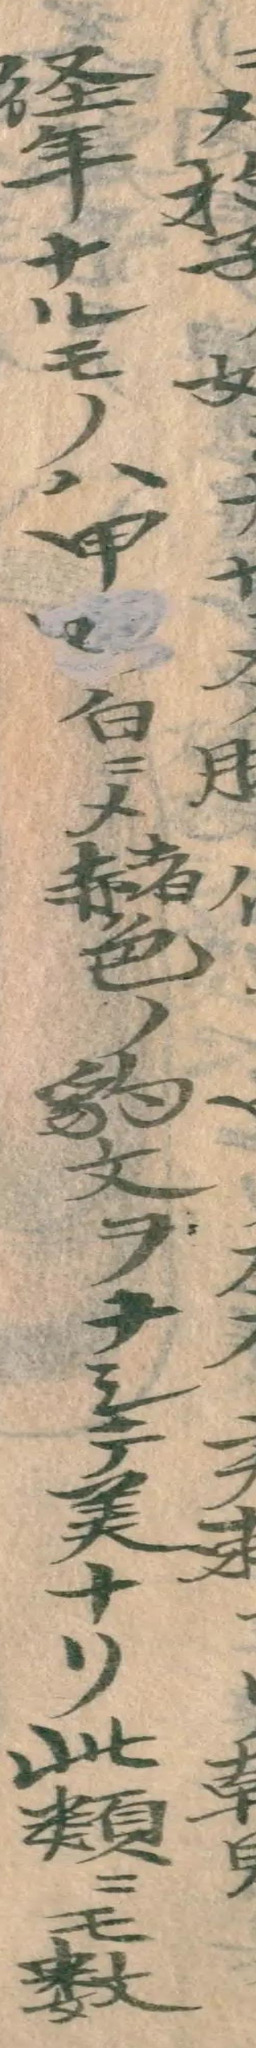経年ナルモノハ甲白ニシテ赭色ノ豹文ヲナシテ美ナリ此類ニモ数
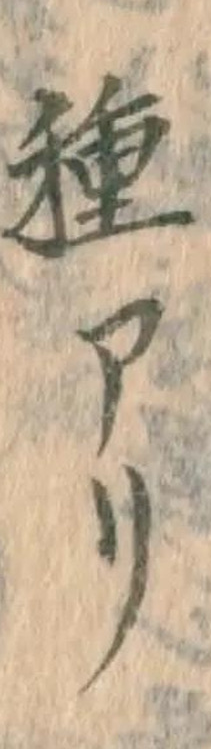種アリ

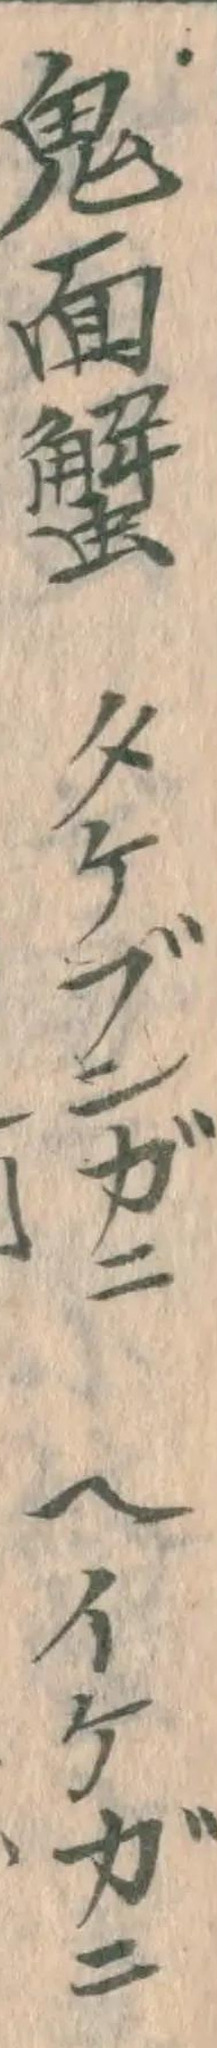鬼面蟹タケブンガニヘイケガニ
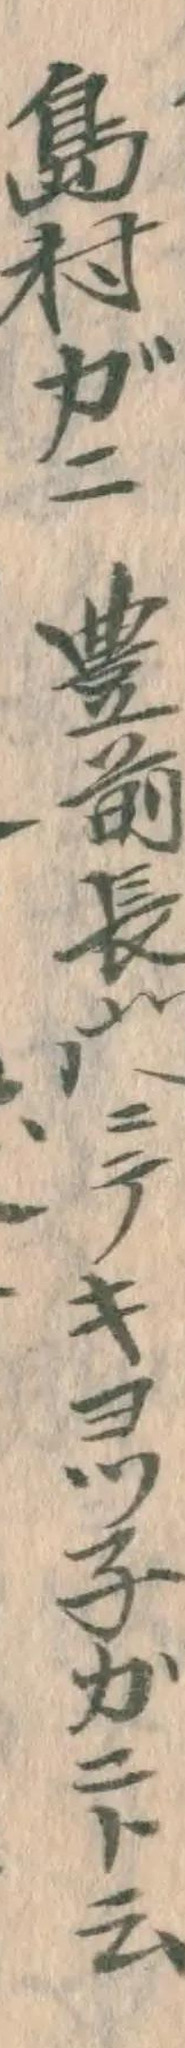島村ガニ豊前長門ニテキヨツネガニト云
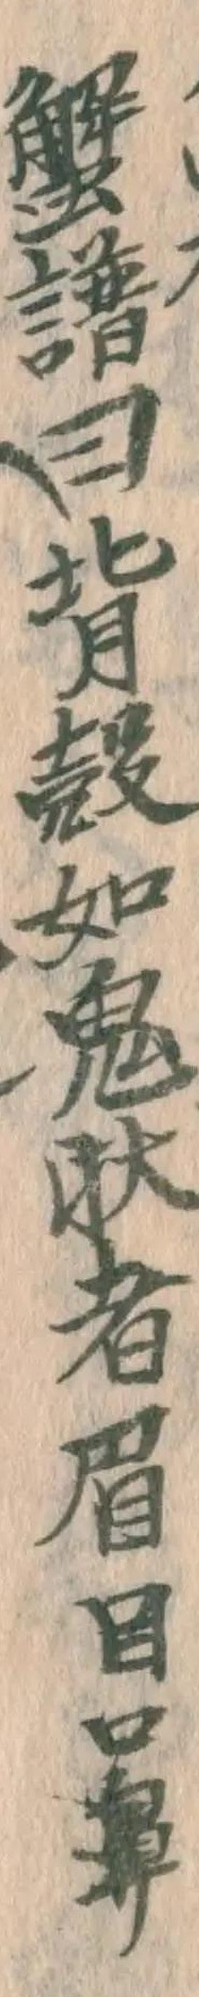蟹譜曰背殻如鬼状者眉目口鼻
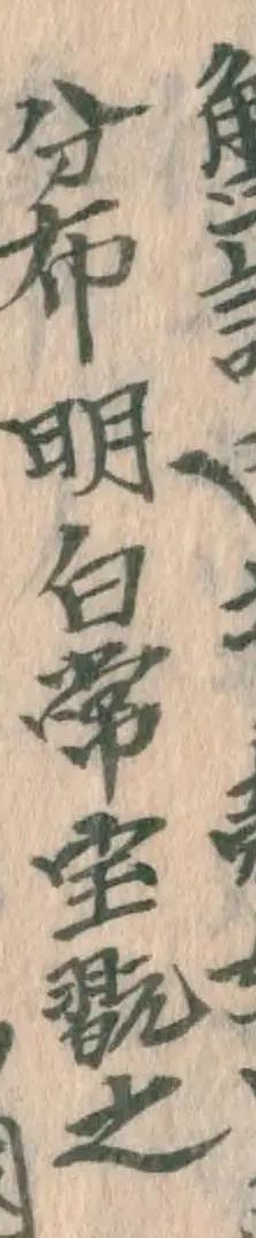分布明白常宝翫之
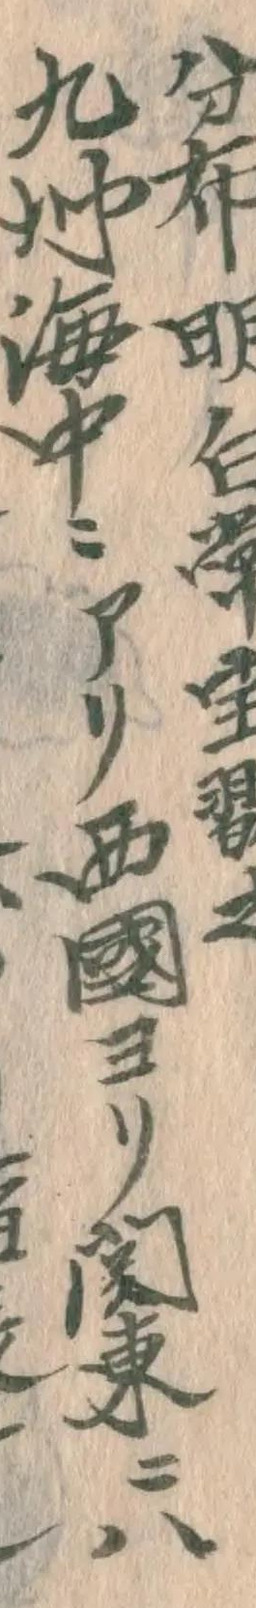九州海中ニアリ西国ヨリ関東ニハ
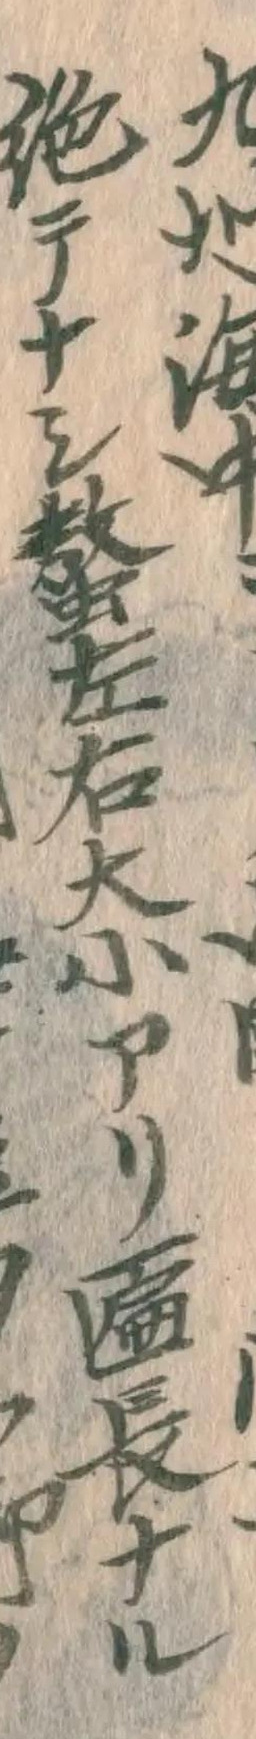絶テナシ螫左右大小アリ匾長ナル
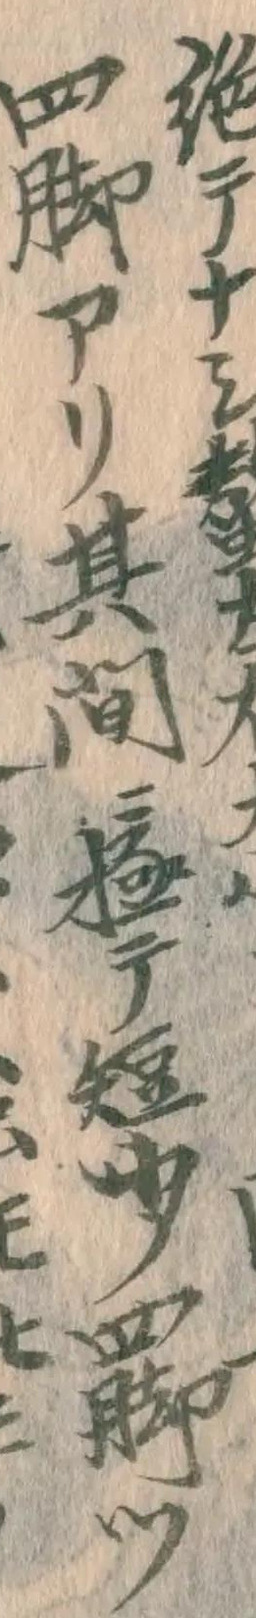四脚アリ其間ニ極テ短少四脚ツ
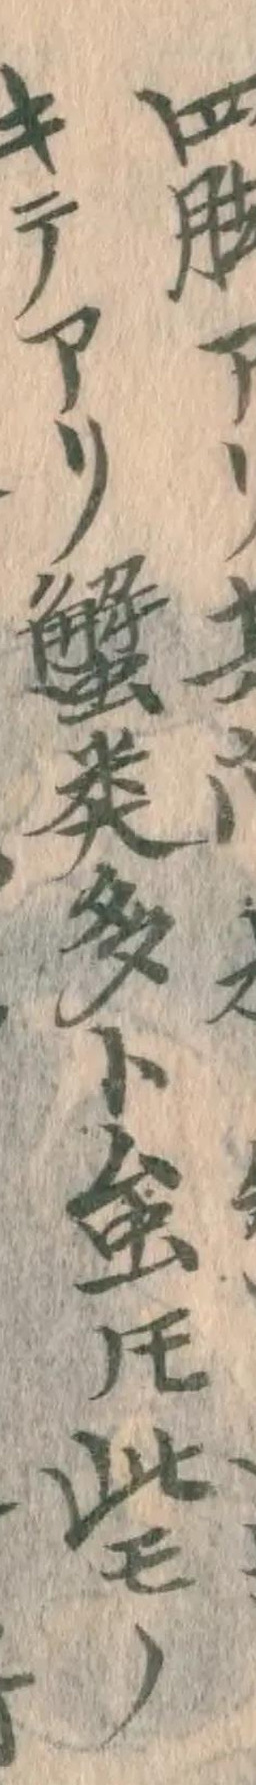キテアリ蟹类多ト𧈧トモ此モノ
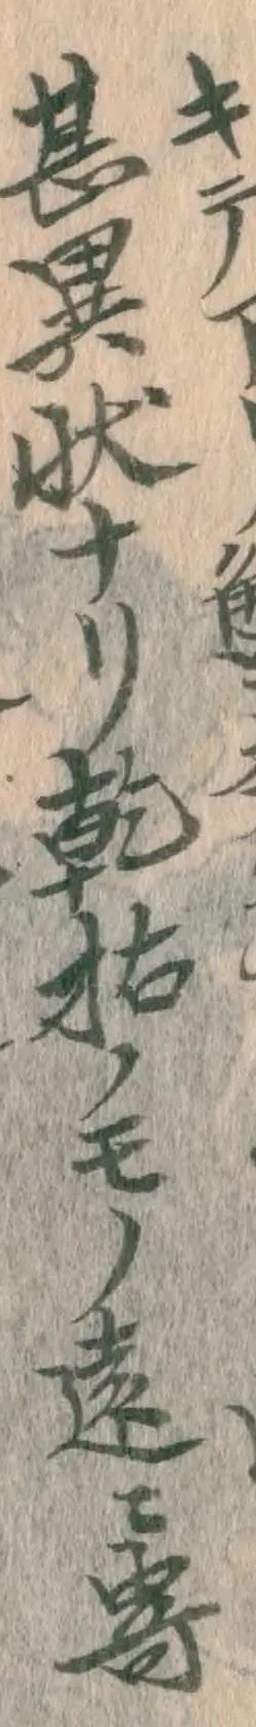甚異状ナリ乾枯ノモノ遠ニ寄
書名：千蟲譜 3巻. [3]
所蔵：国立国会図書館 National Diet Library, JAPAN
